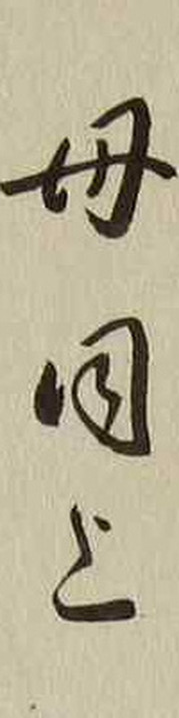母同上
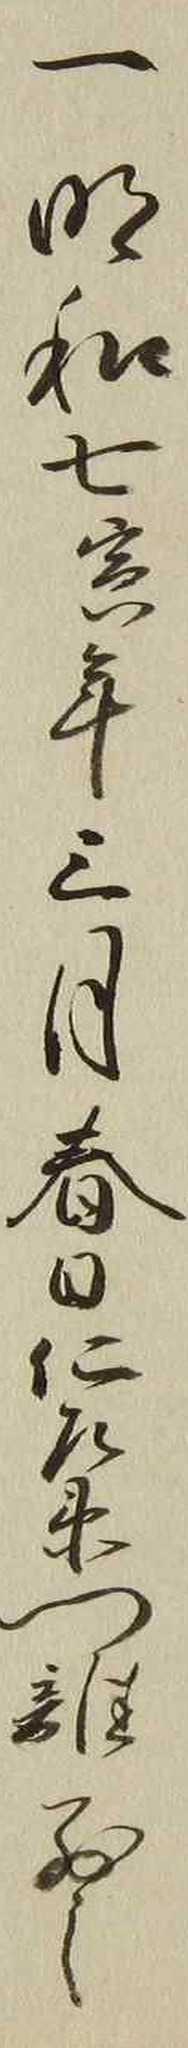一明和七寅年三月春日仁左衛門離別候
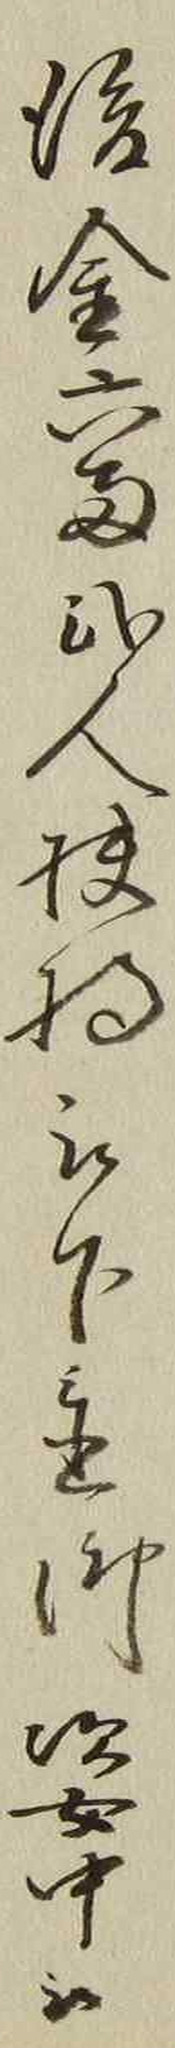後金六両弐人扶持被下置御次女中被
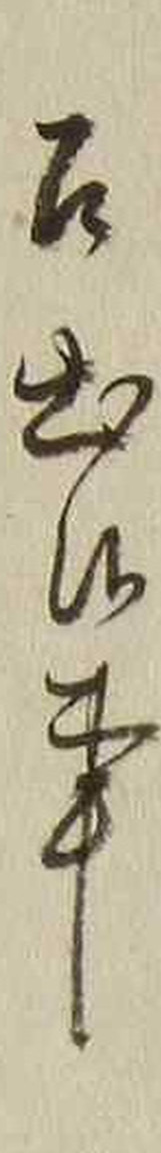召出候事
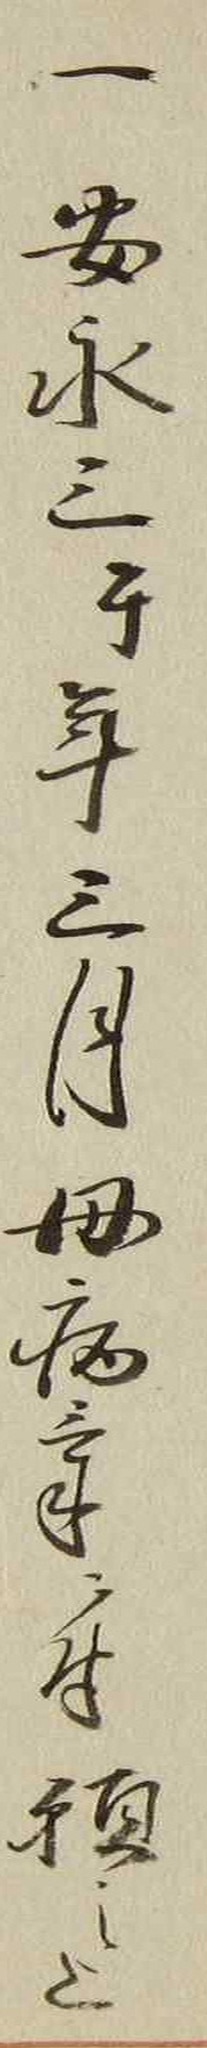一安永三午年三月母病気ニ付願之上
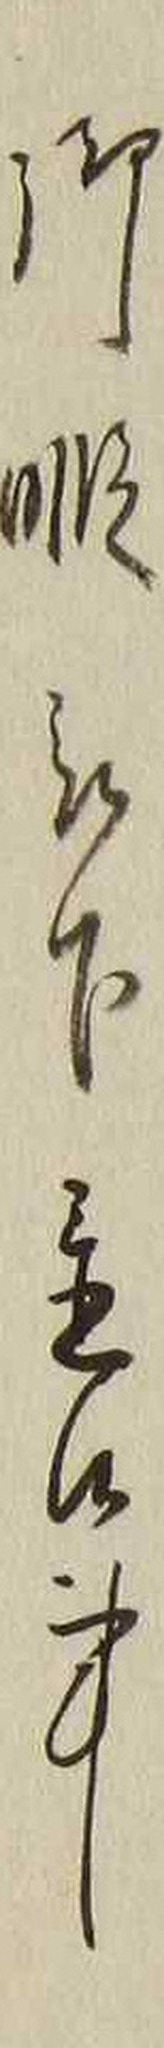御暇被下置候事
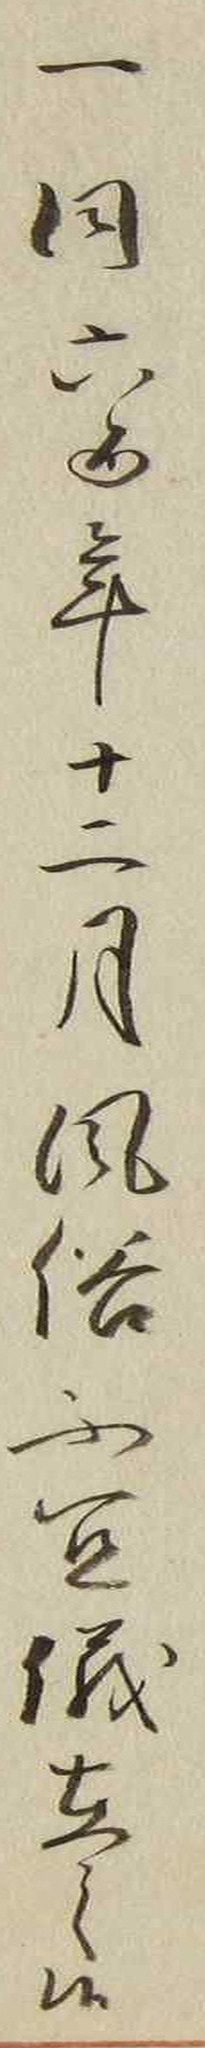一同六酉年十二月風俗不宜儀在之候
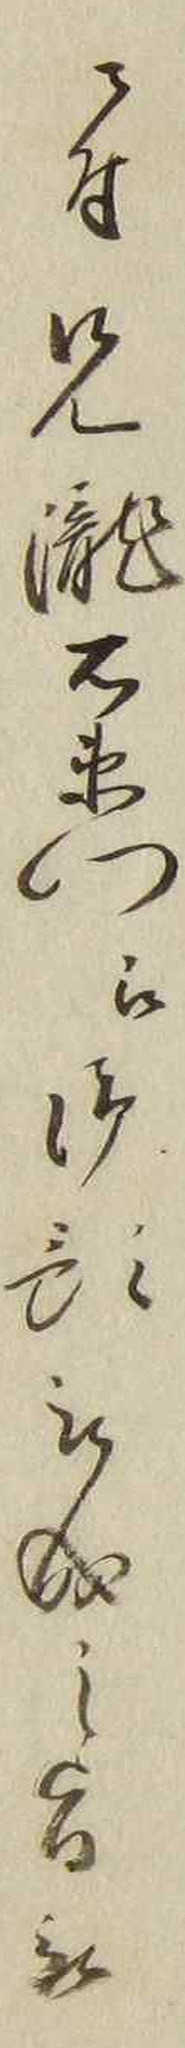二付兄滝石衛門江御預被成候旨被

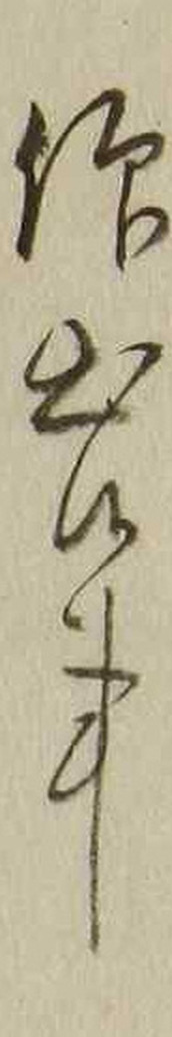仰出候事
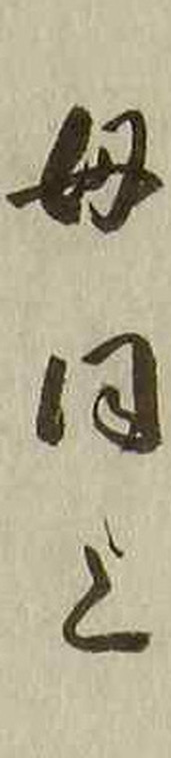母同上
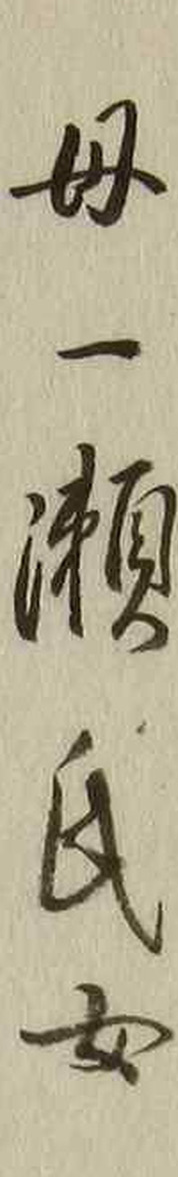母一瀬氏女
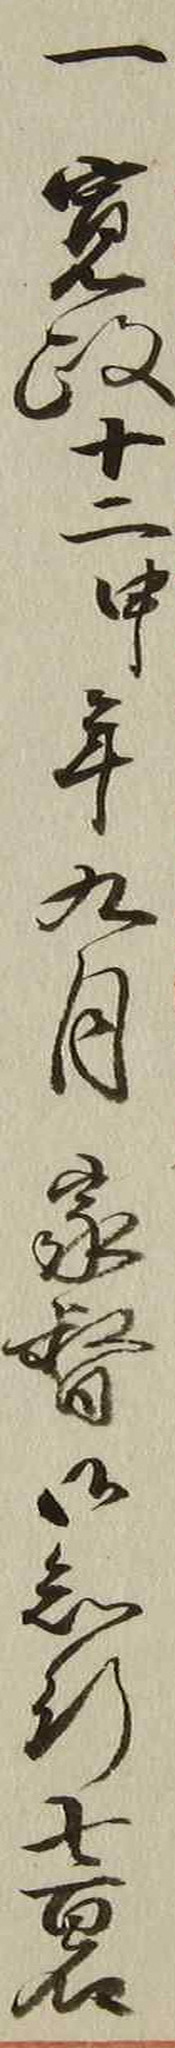一寛政十二申年九月家督御知行七百石
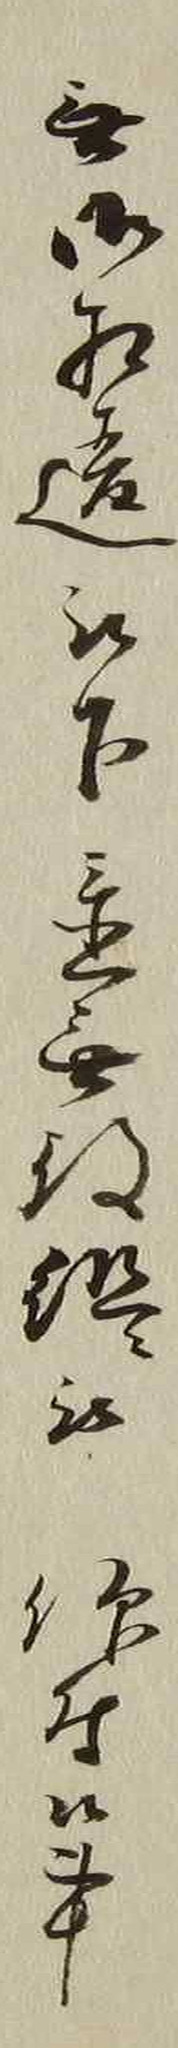無御相違被下置無役組ニ被仰付候事
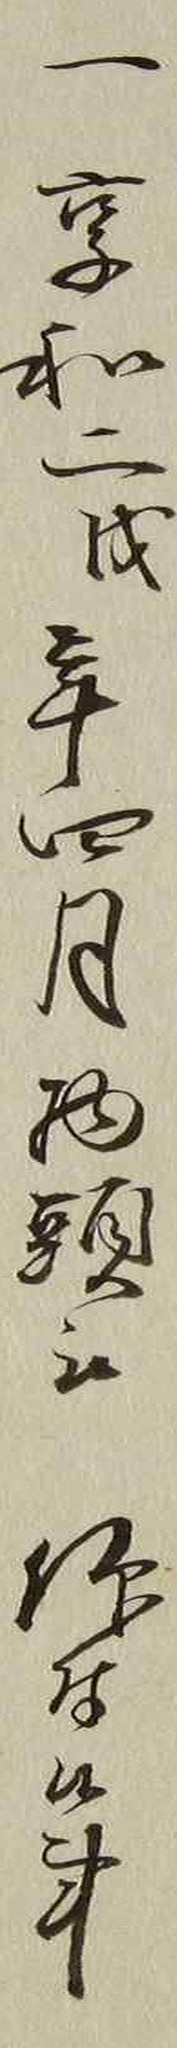一享和二戊年四月物頭被仰付候事
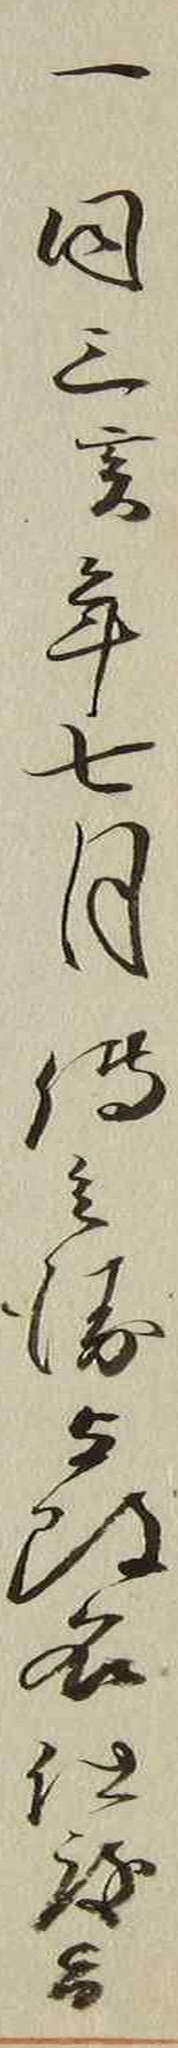一同三亥年七月伝兵衛与改名仕度旨
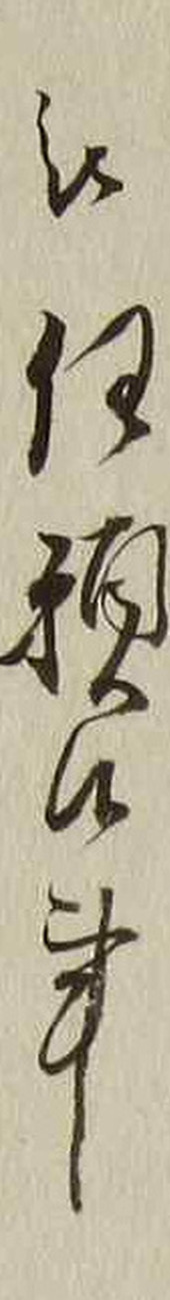被任願候事
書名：諸士系譜　巻之122　よ之部5
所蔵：会津若松市立会津図書館
